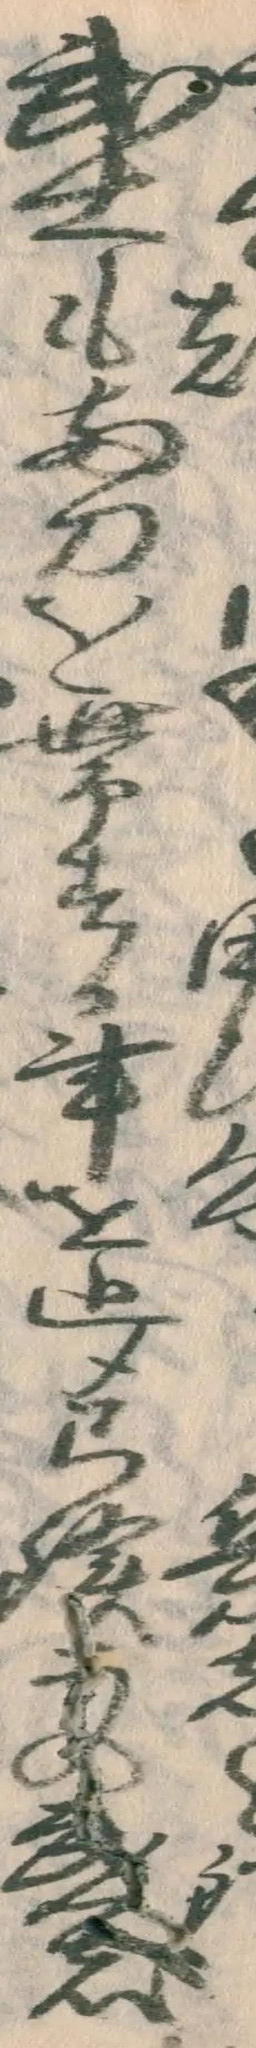武士も両刀を帯する事を止メ弓鎗の武器
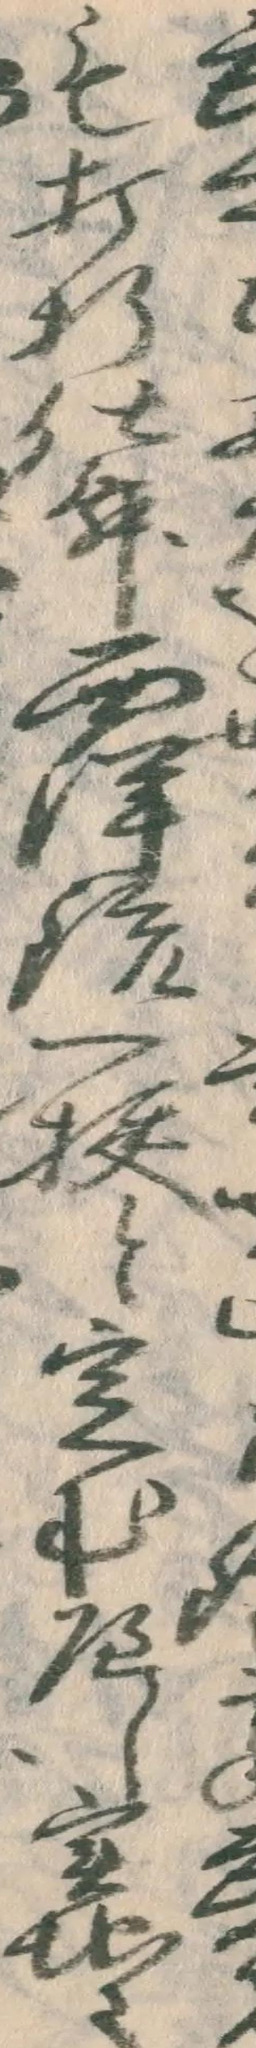も打折仕舞西洋銃一挺と定むへし実地ニ
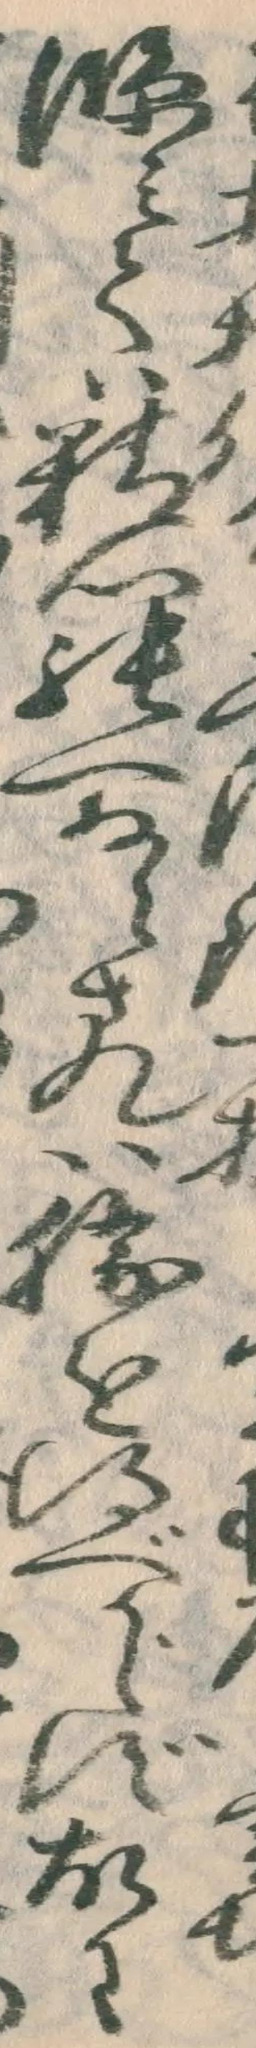臨ミてハ精心純一ならされハ勝を得べからず故ニ
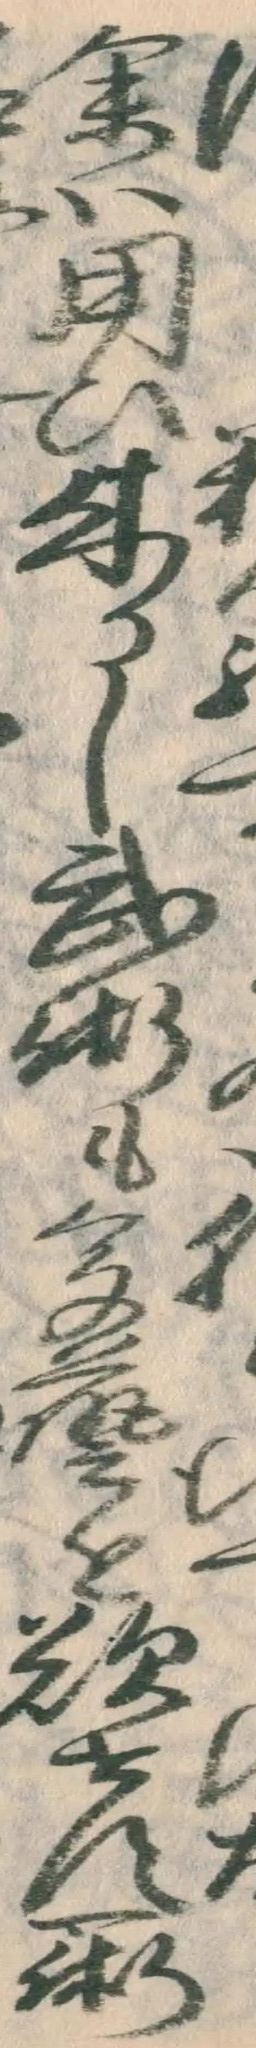余ハ用ひ来りし武術も多藝を欲せす一術
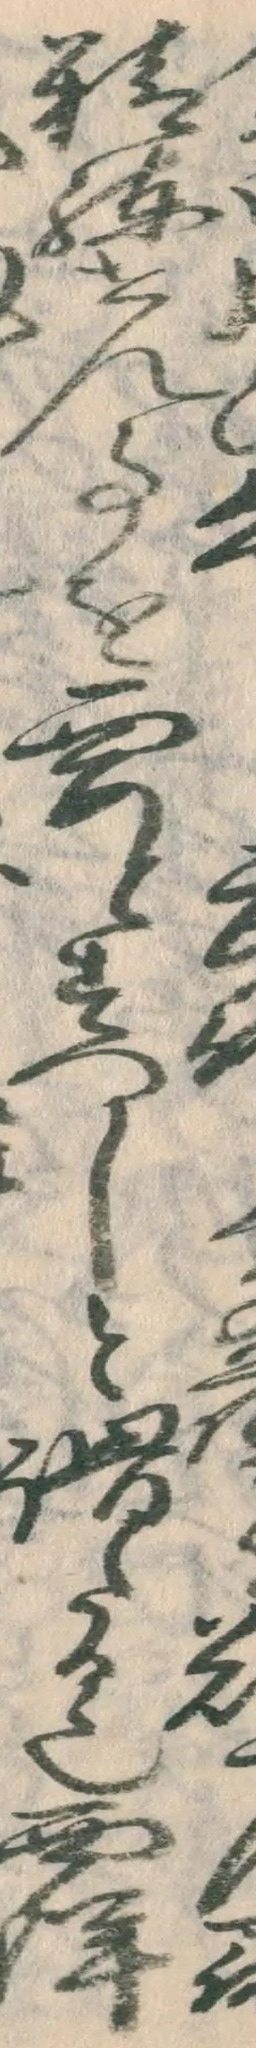精練せん事を要とすへしと謂たる也西洋
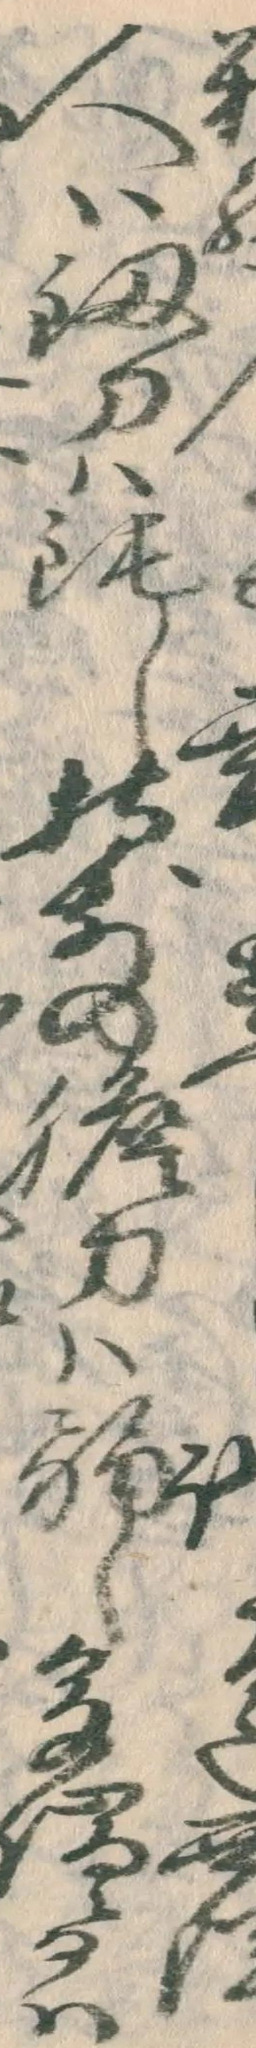人は剱刀ハ鈍し持前の膽力ハ弱し多端ニ而ハ
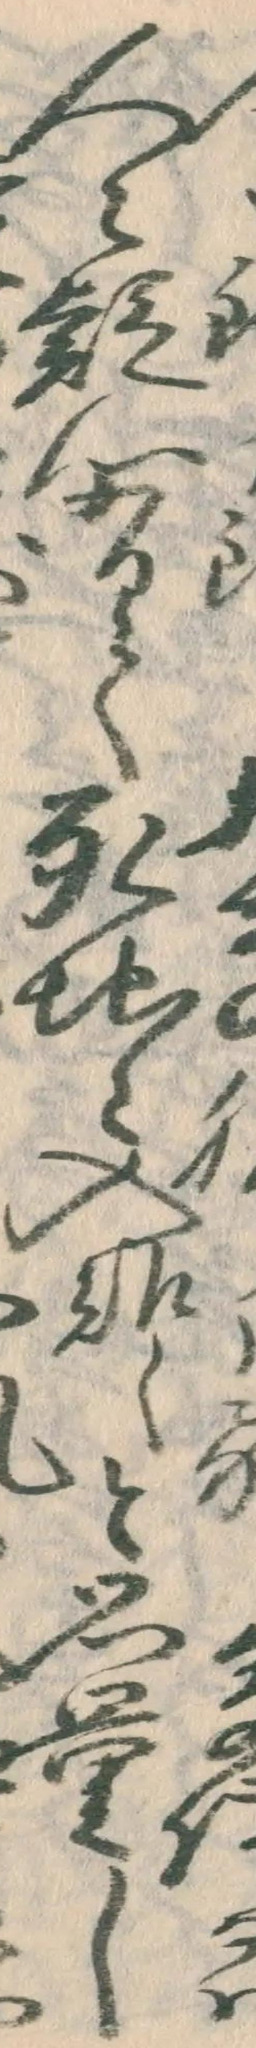人々疑心有て死地ニ入難しと思量し
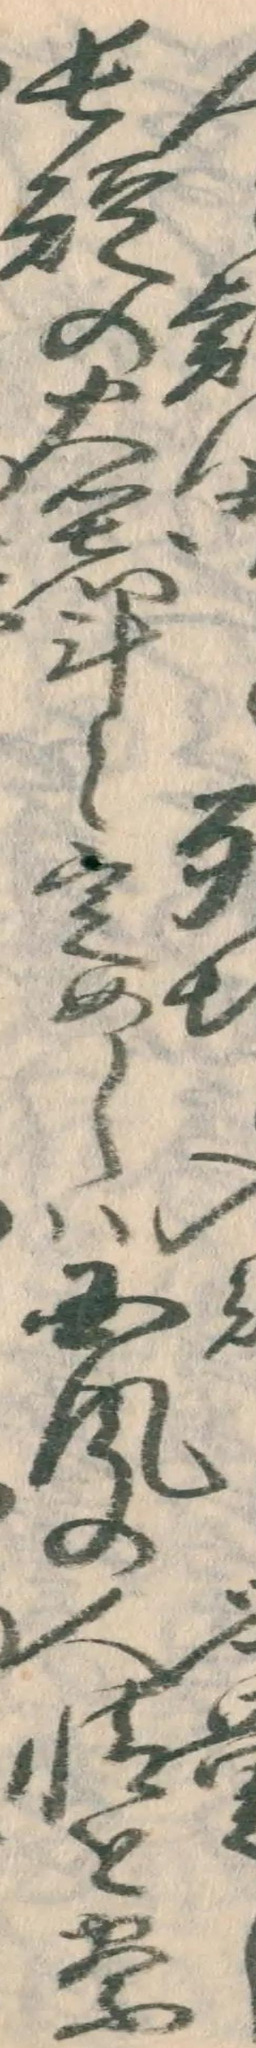長短の火器斗し定めしハ国風の人情を察
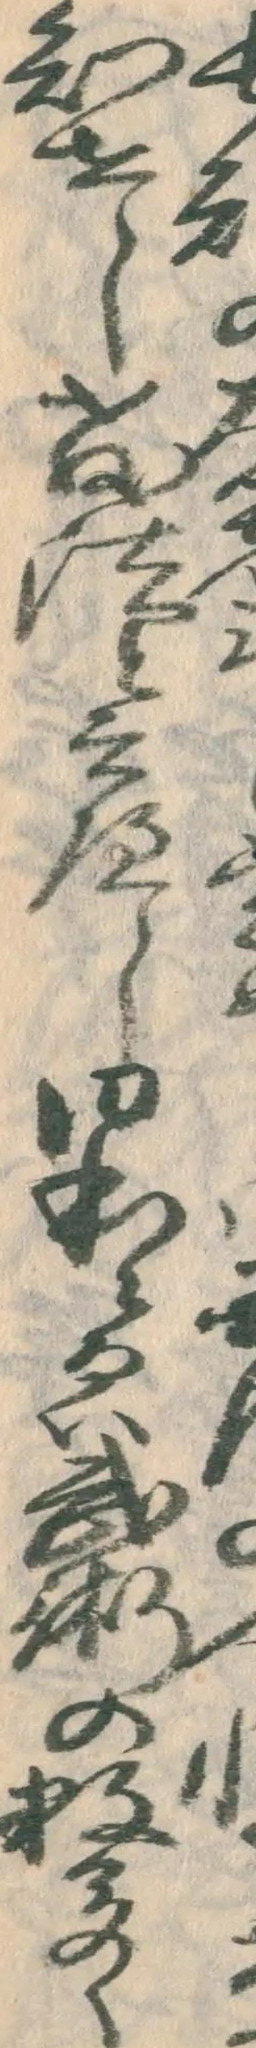知せし教法と云へし日本ニ而ハ武術の数多く

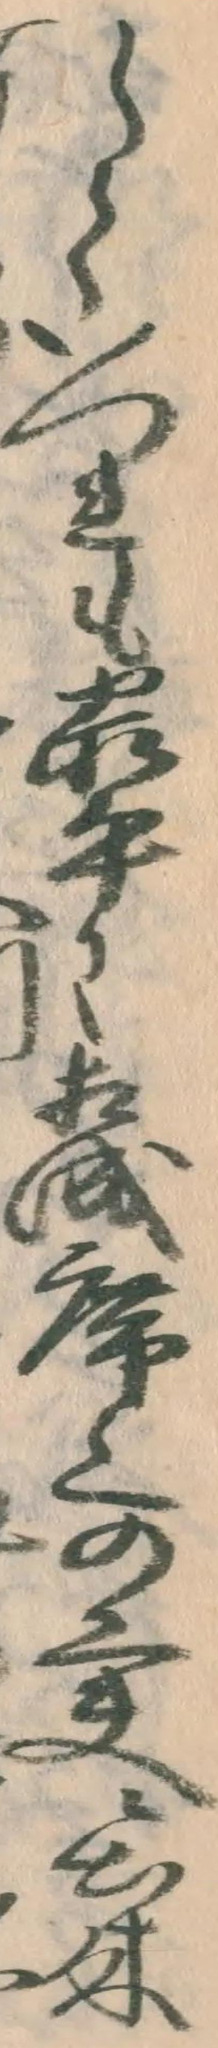していつれも泰平に相成席上の工夫ニ出来
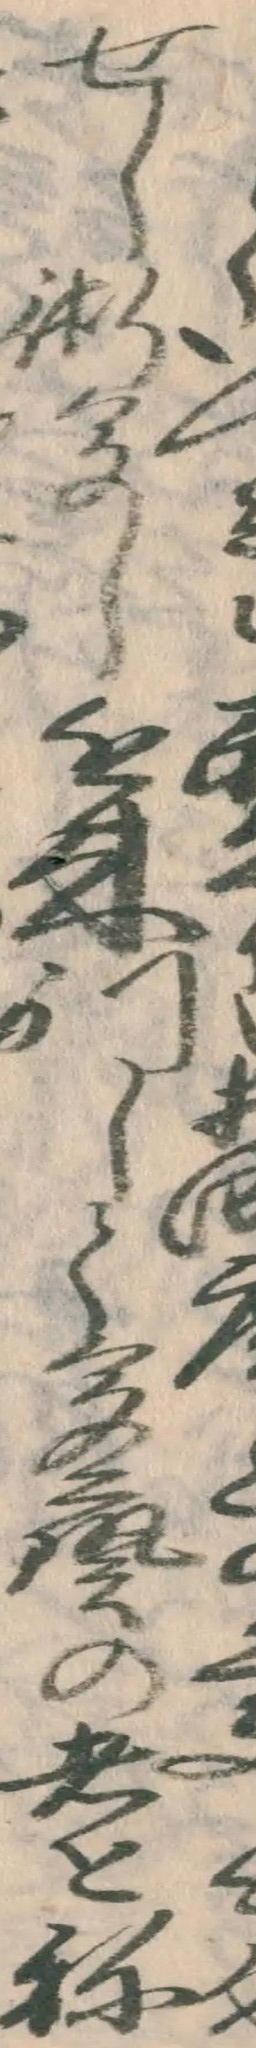せし術多し近来別して多藝の者と称
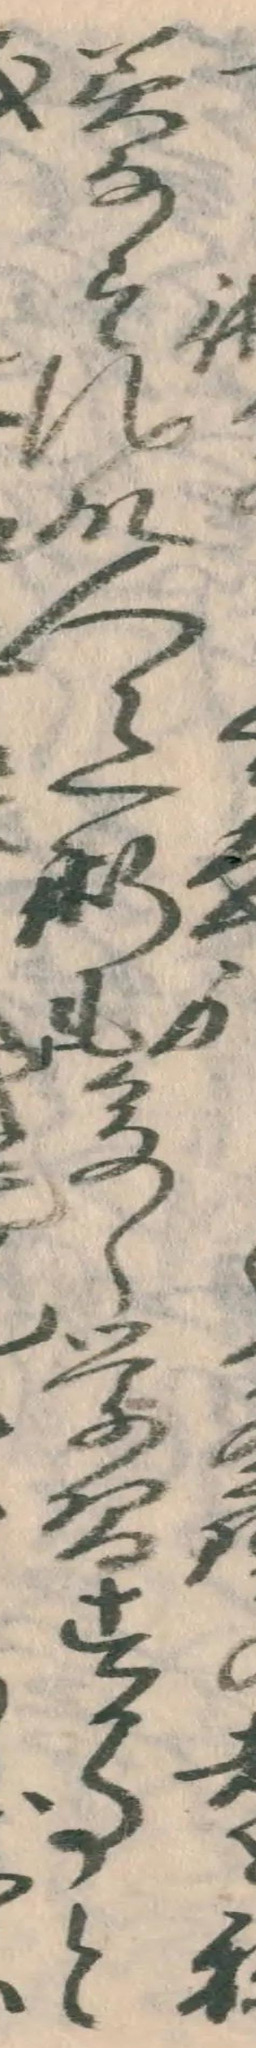美なす風故人々一術も多く学習する事と
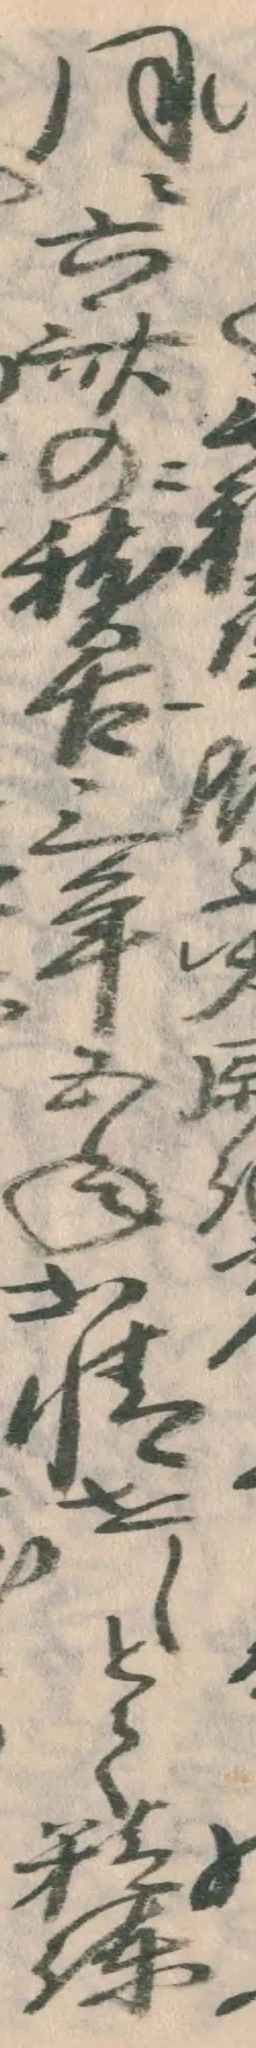月ニ六斎の稽古三年五年出精せしとて精練
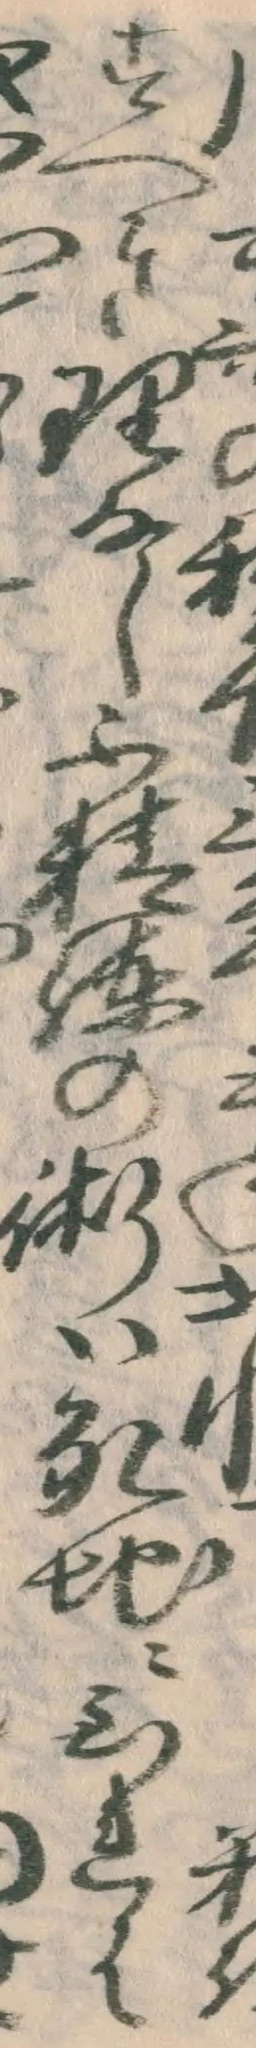すへき理なし不精練の術ハ死地ニ至れは
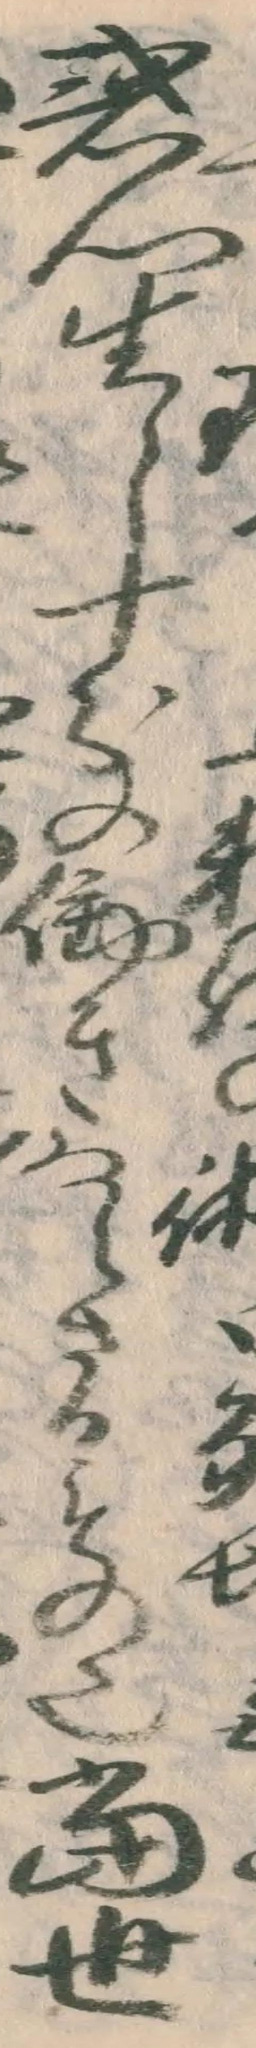惑心生し十分の働きならさるもの也當世
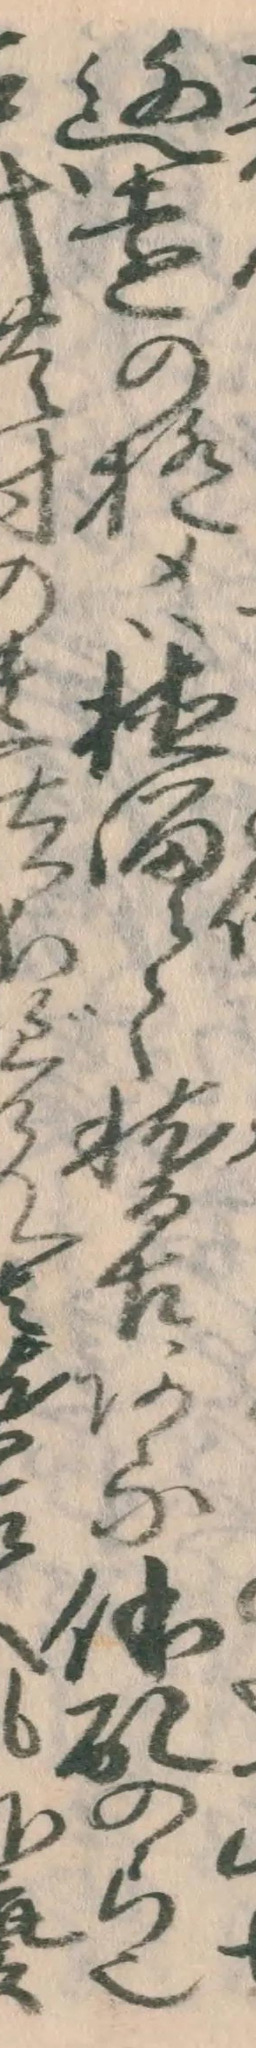遷遠の極メハ植溜ニて稽古ある体配の弓也
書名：麗斎叢書. 20
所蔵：国立国会図書館 National Diet Library, JAPAN
